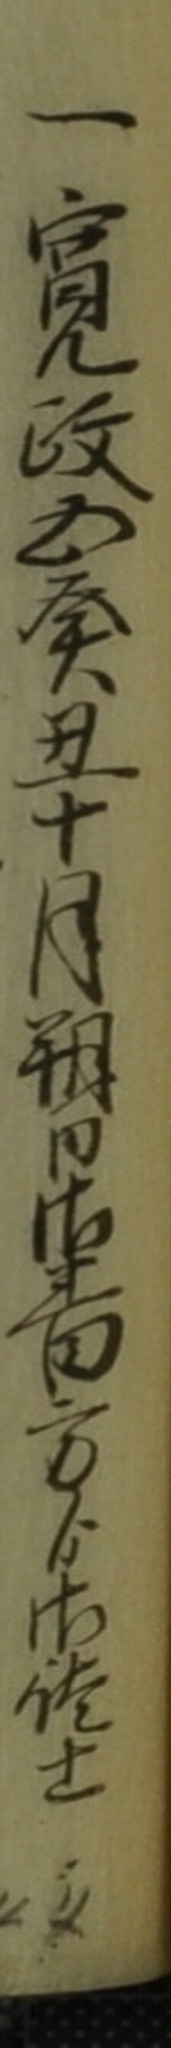一寛政五癸丑十月朔日御番方ゟ御徒士
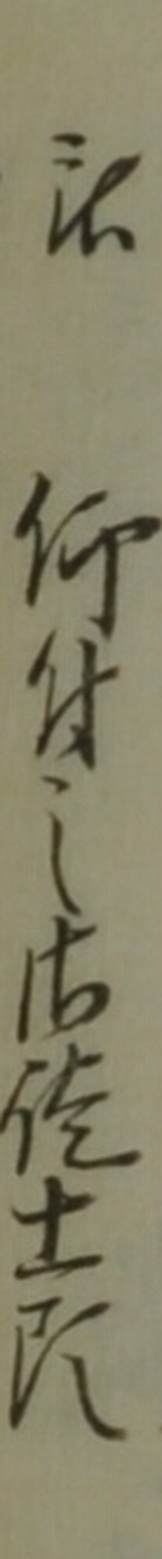被仰付之御徒士頭
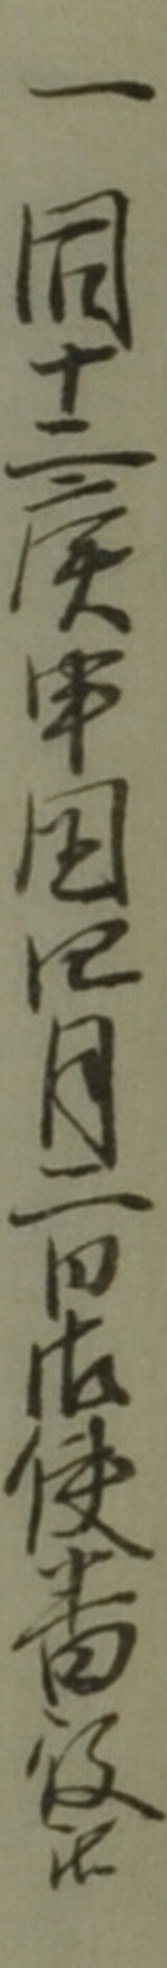一同十二庚申閏四月二日御使番役被
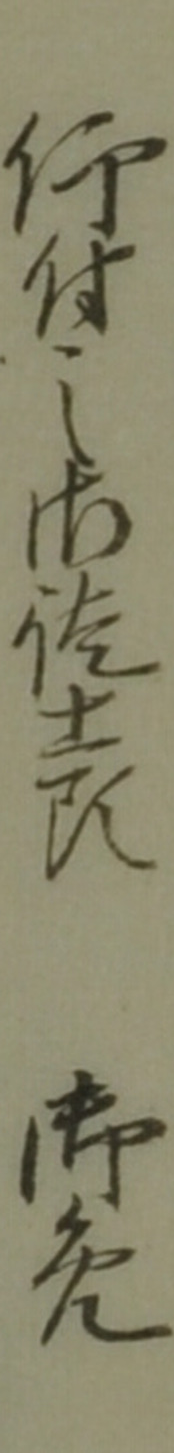仰付之御徒士頭御免
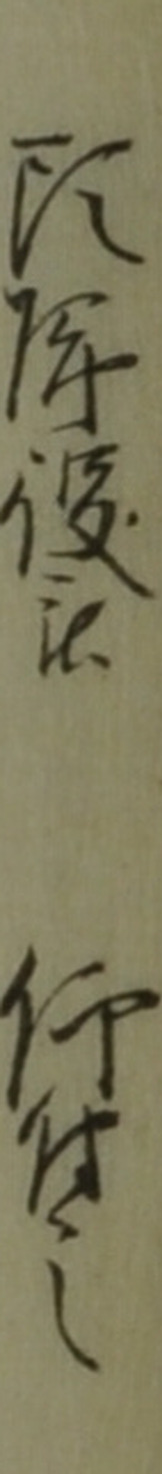頭帰役被仰付之
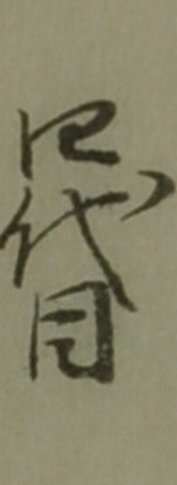四代目
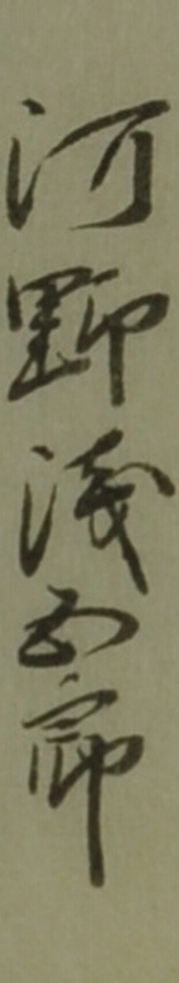河野浅五郎
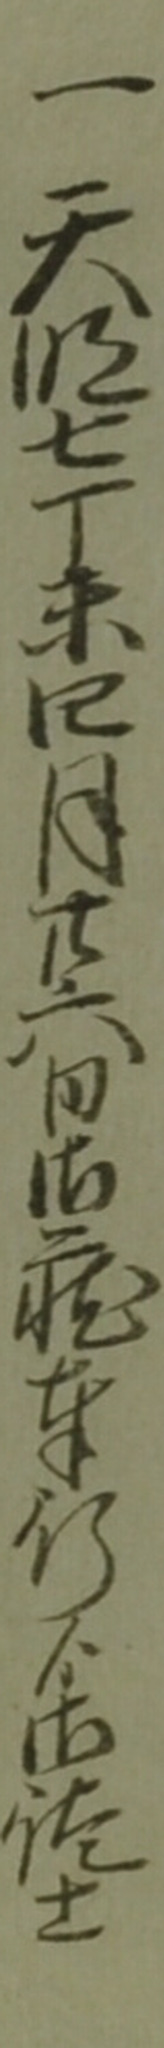一天明七丁未四月廿六日御蔵奉行ゟ御徒士
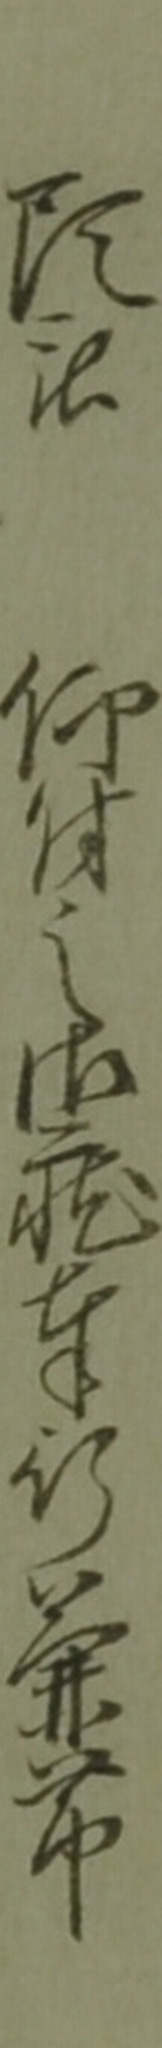頭被仰付之御蔵奉行兼帯
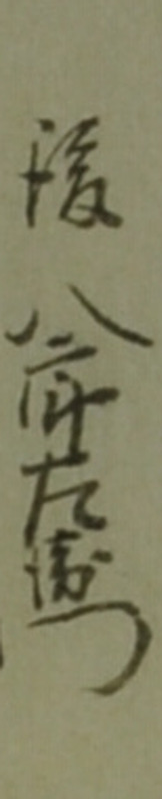後八郎左衛門
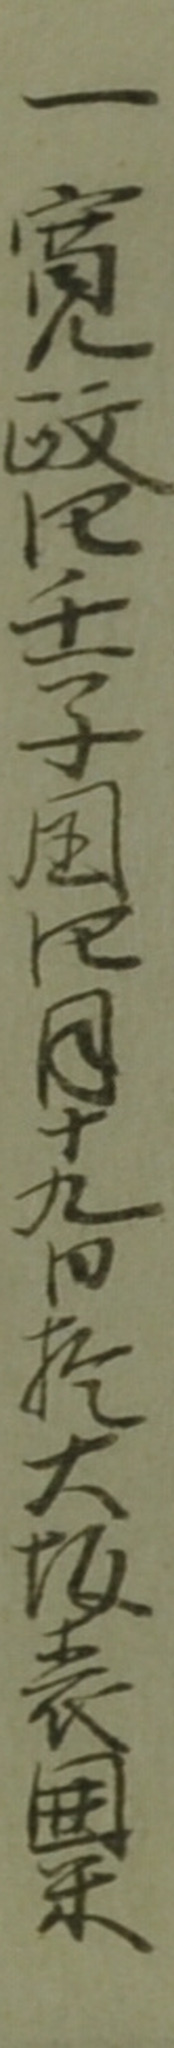一寛政四壬子閏四月十九日於大坂表囲米
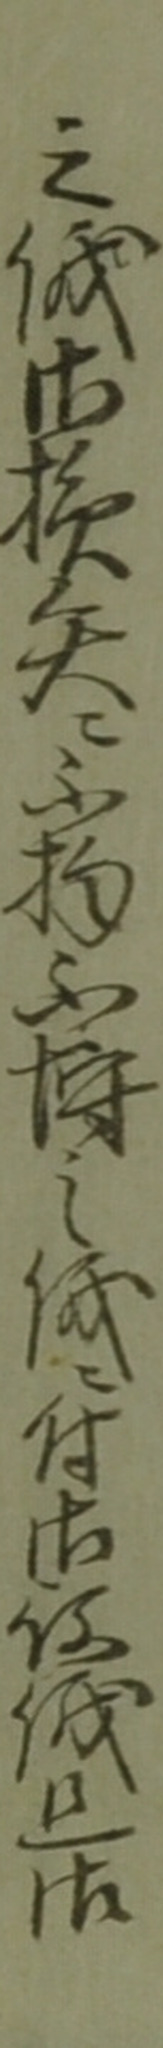之儀御挽矢ニ不物不埒之儀ニ付御役儀且御
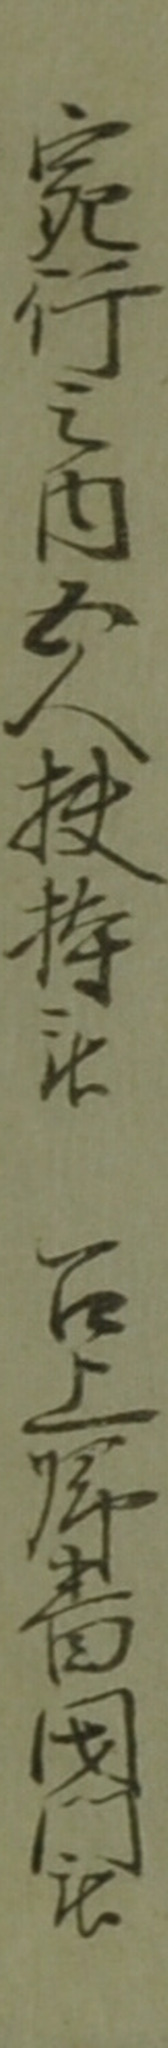宛行之内五人扶持被召上帰番閉門被
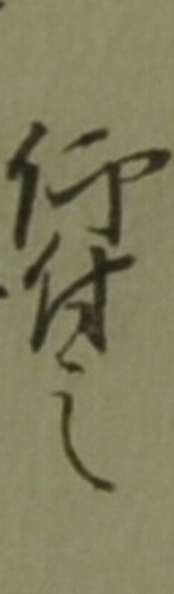仰付之
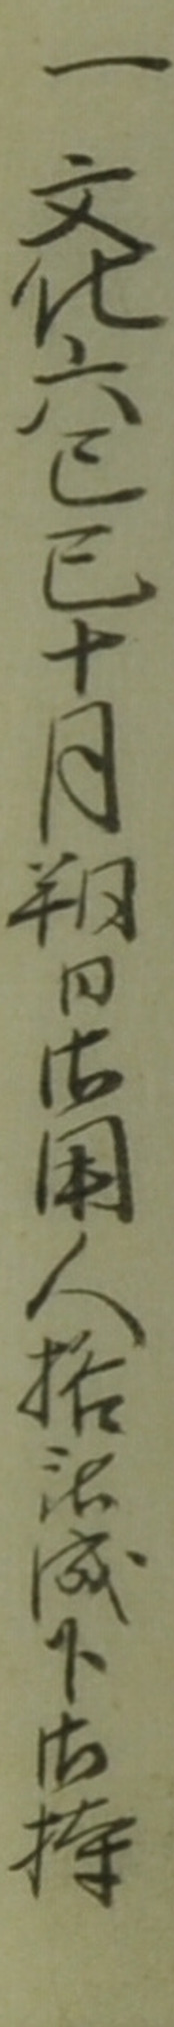一文化六己巳十月朔日御用人格被成下御持
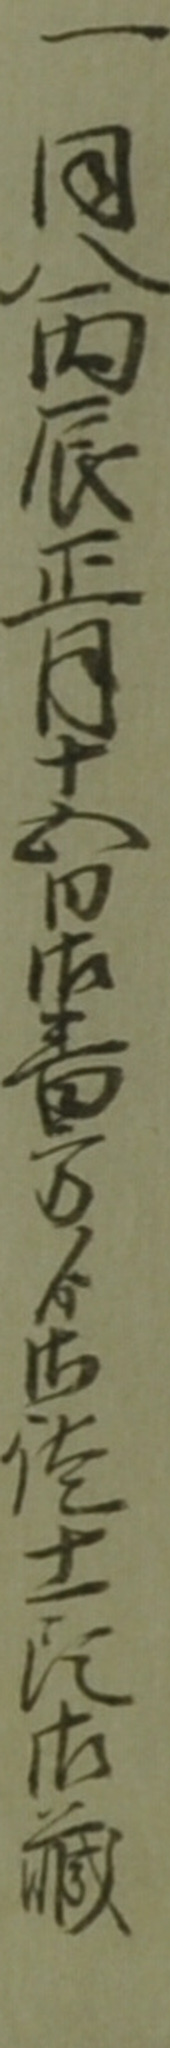一同八丙辰正月十五日御番方ゟ御徒士頭御蔵
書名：諸御役代々録（六）
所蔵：伊那市立高遠町図書館・合同会社AMANE
